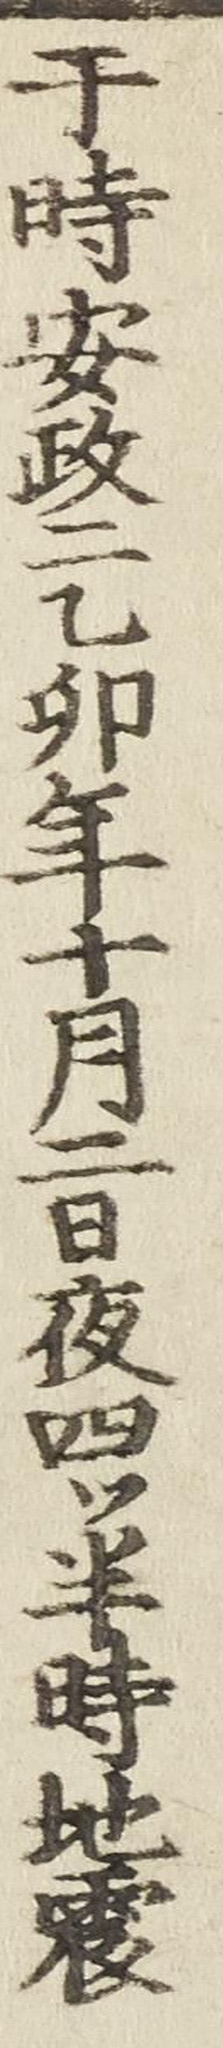于時安政二乙卯年十月二日夜四ッ半時地震
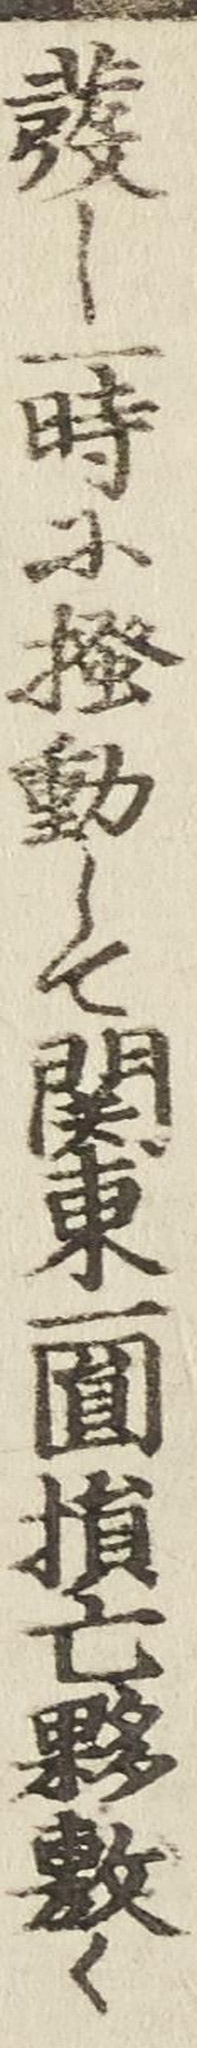発し一時に揆動して関東一円損亡夥敷く
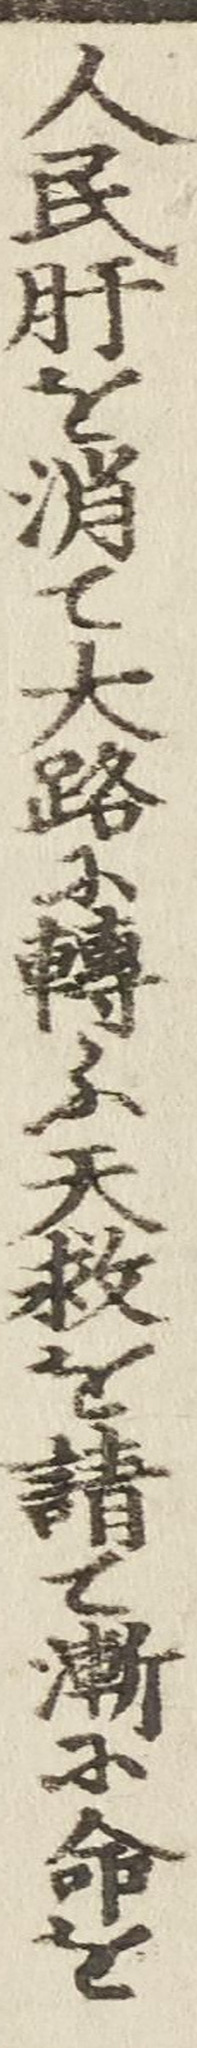人民肝を消て大路に転ふ天救を請て漸に命を
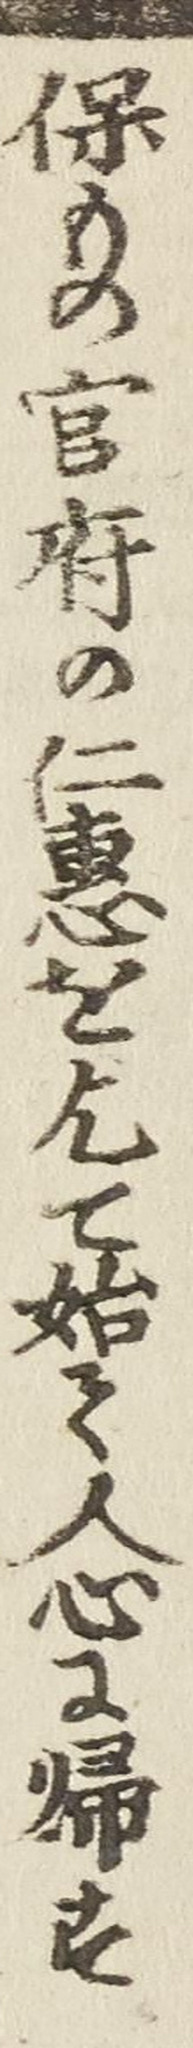保もの官府の仁恵を乞て始て人心に帰す
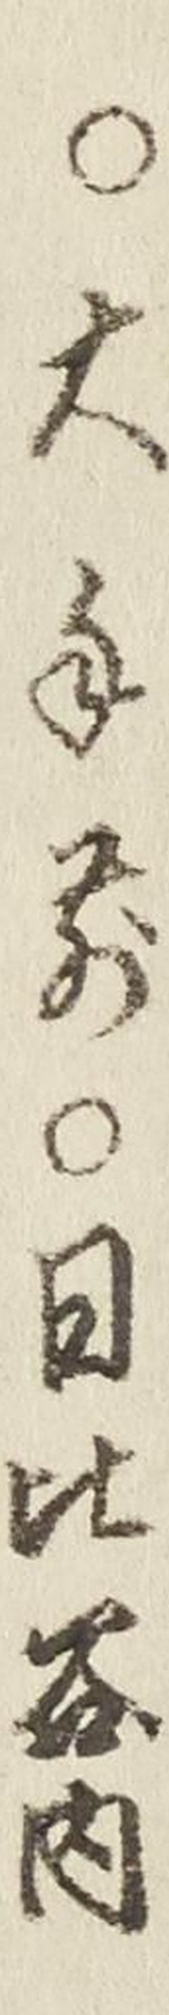○大手前○日比谷内
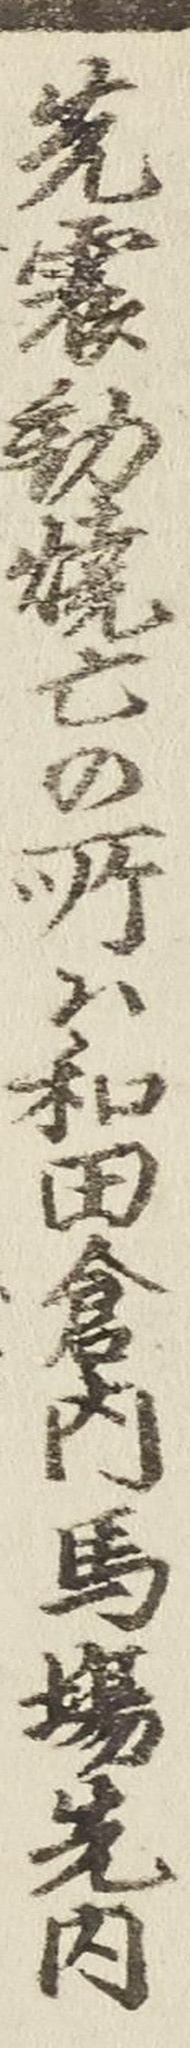先震動焼亡の所ハ和田倉内馬場先内
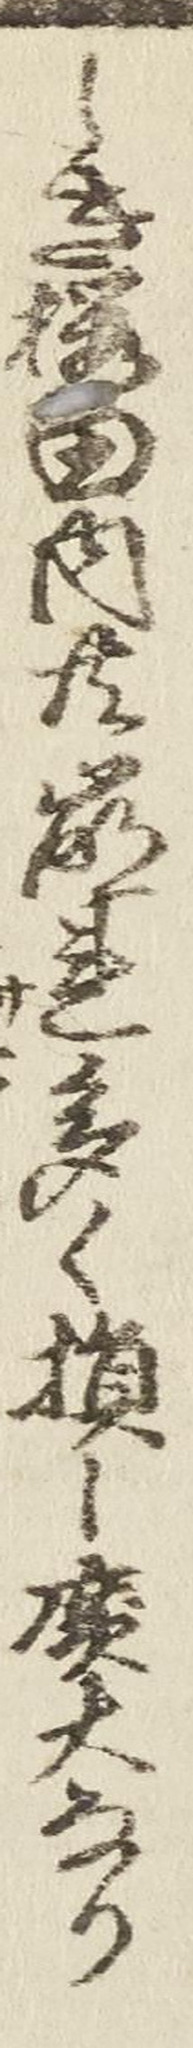しき桜田内共崩れ多く損し広大なり
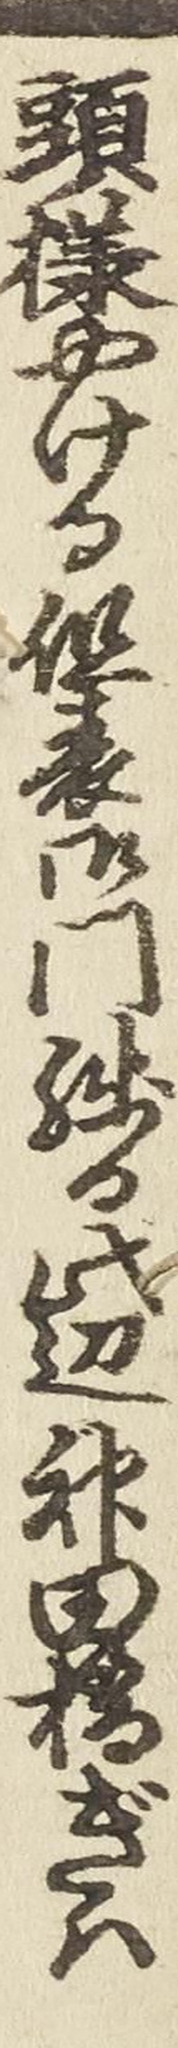頭様やける但表御門残る此辺神田橋ぎは
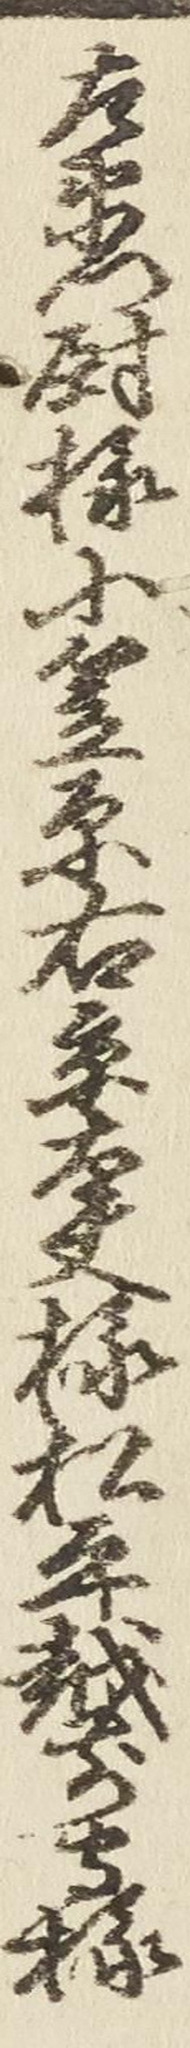左衛門尉様小笠原右京大夫様松平越前守様
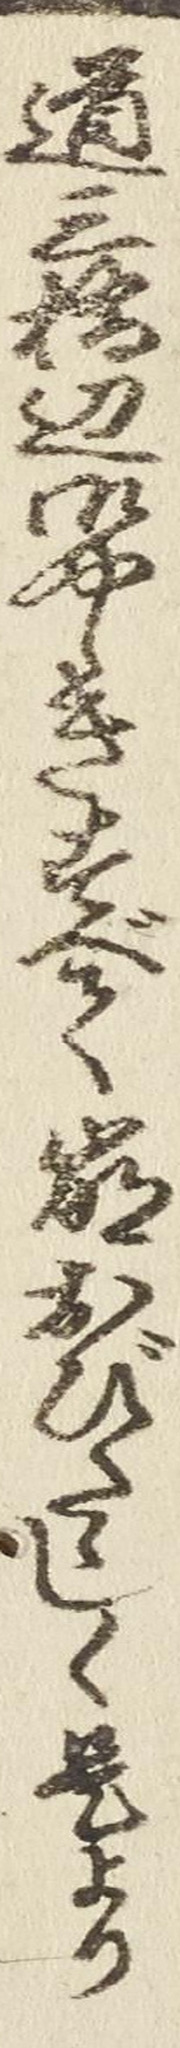道三橋辺御やしきすべて崩おびたゝしく是より
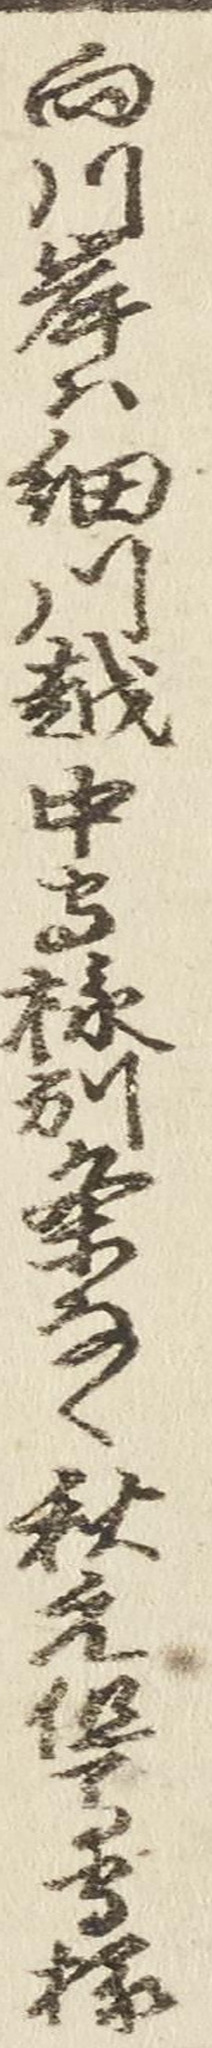向川岸は細川越中守様別条なく秋元但馬守様
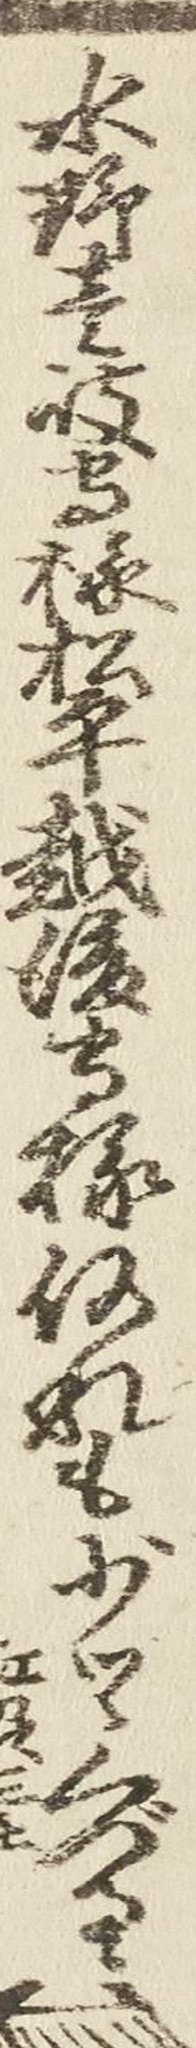水野壱岐守様松平越後守様何れも少ツヽくづるゝ
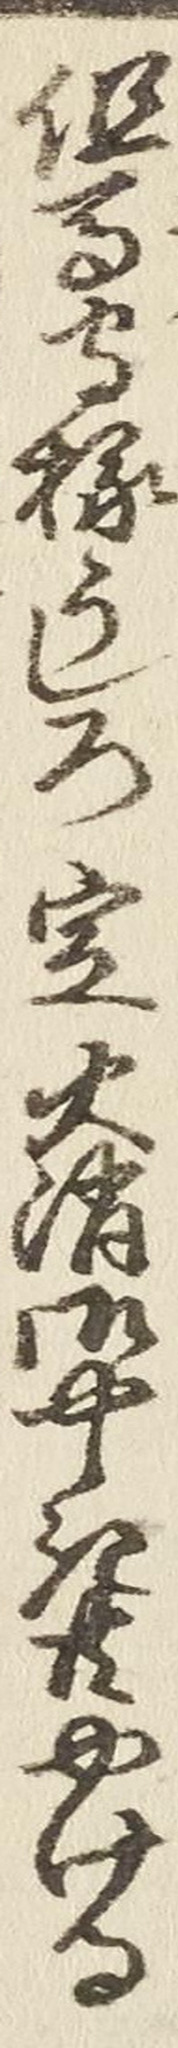但馬守様うしろ定火消御やしき共やける
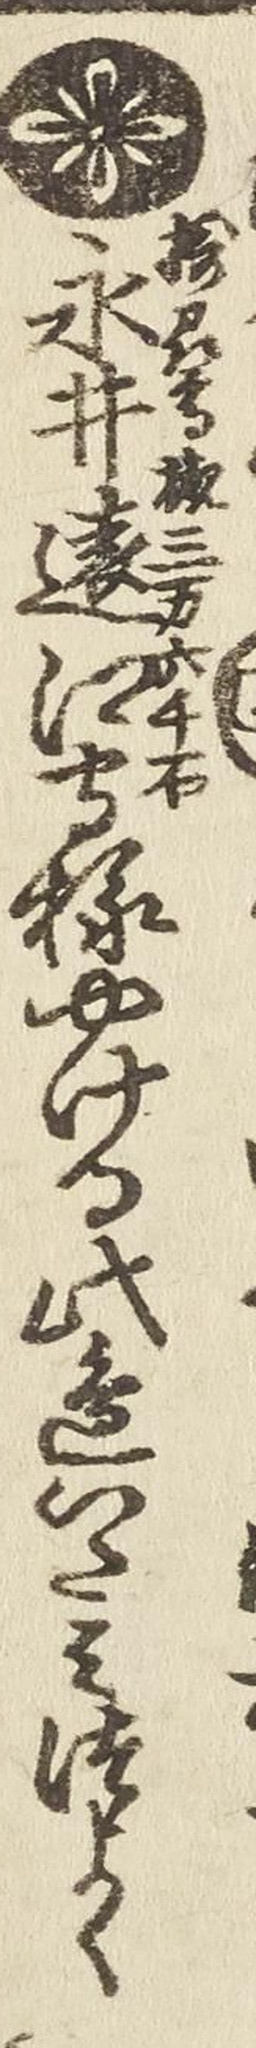摂州高槻三万六千石永井遠江守様やける此辺いたみつよく
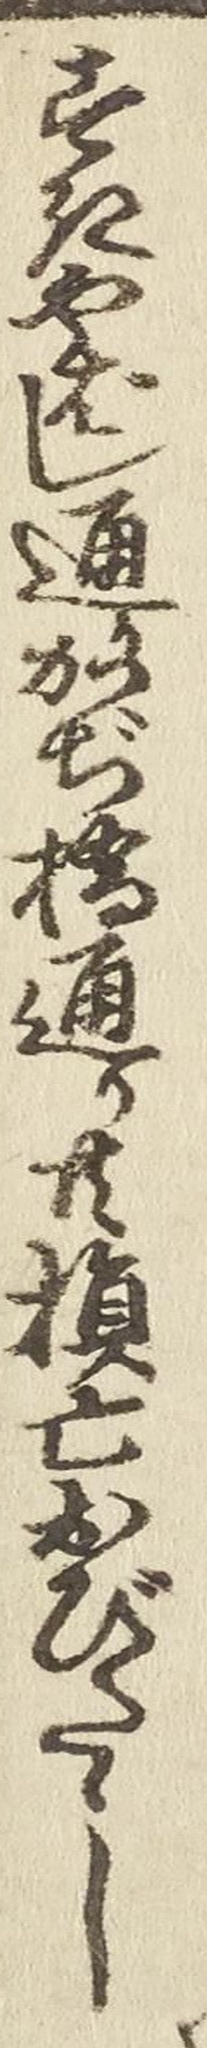すきやはし通りかぢ橋通り共損亡おびたゝし

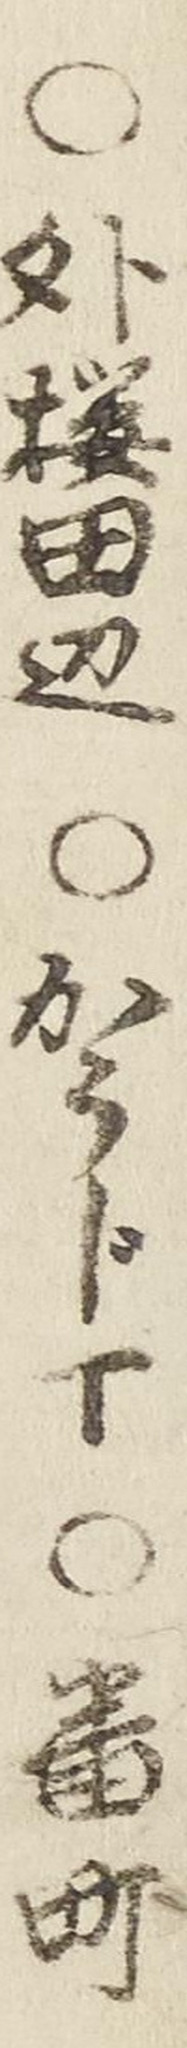第弐○外桜田辺○かうじ丁○番町
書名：江戸みやげ
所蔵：東京大学地震研究所図書室 Earthquake Research Institute Library, The University of Tokyo, JAPAN
